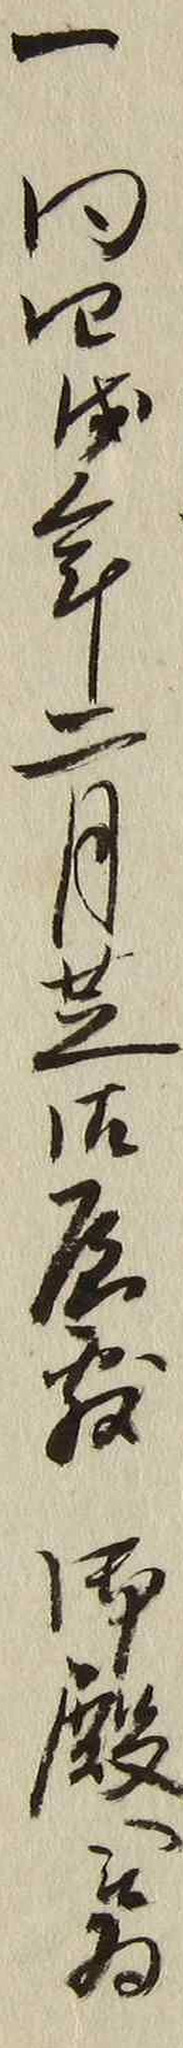一同四戌年二月芝御屋敷御殿へ被為
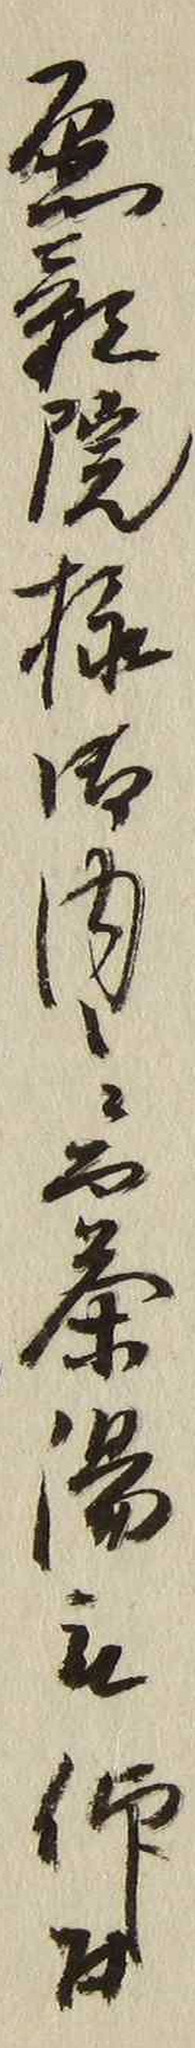愿彰院様御内々ニ而茶湯被仰付
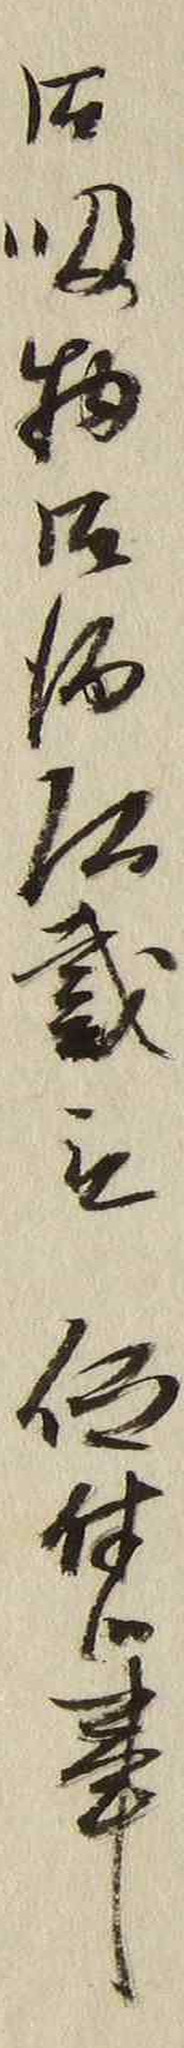御吸物御酒頂戴被仰付候事
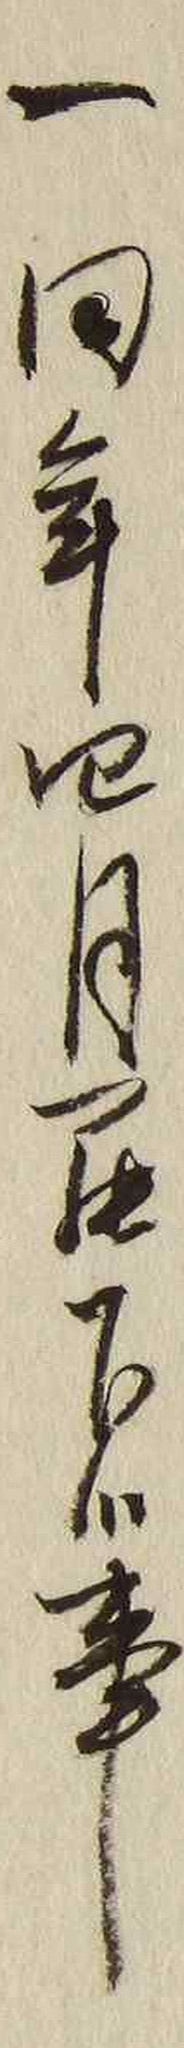一同年四月罷下候事

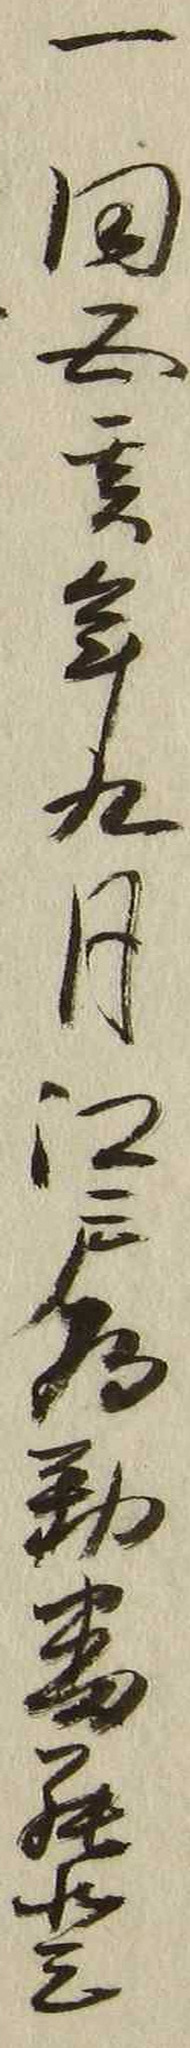一同五亥年九月江戸為勤番罷登
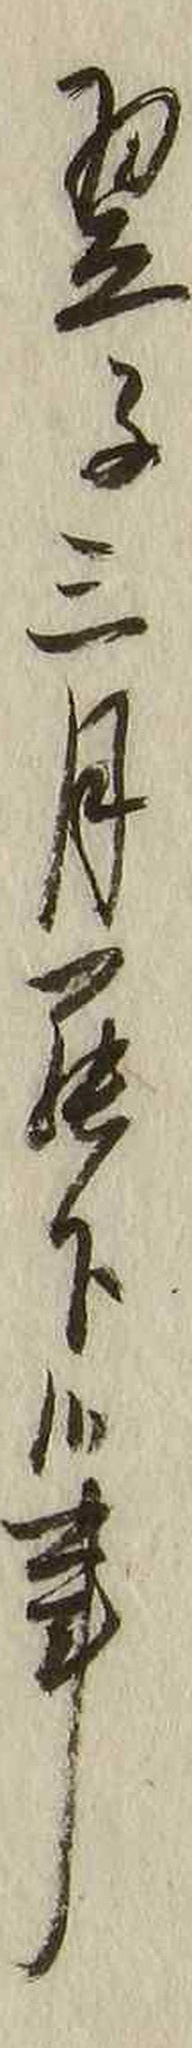翌子三月罷下候事
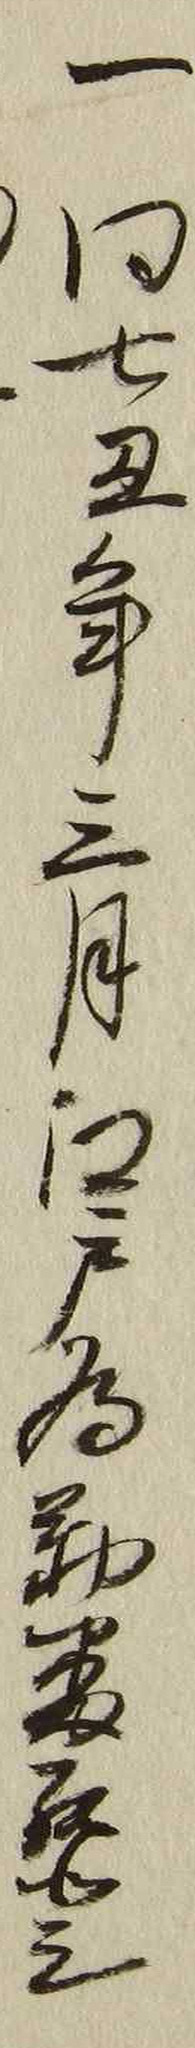一同七丑年三月江戸為勤番罷登
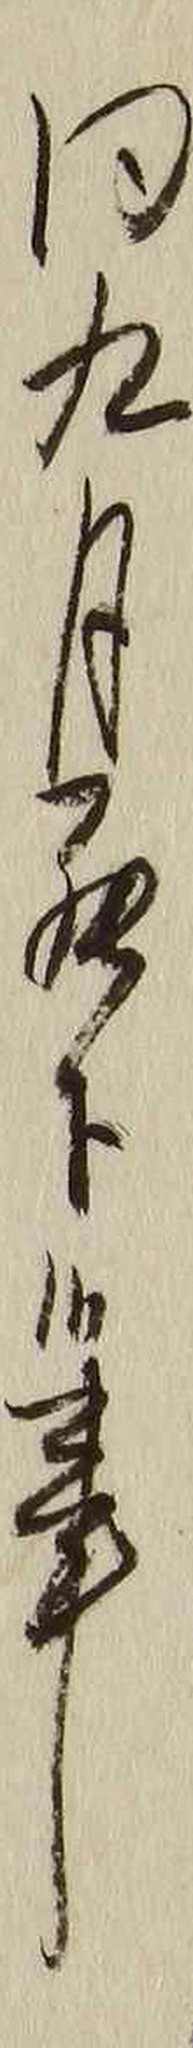同九月罷下候事
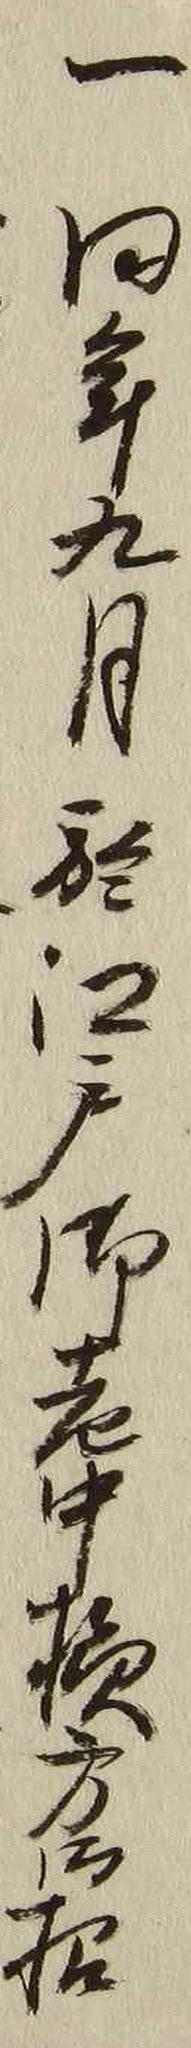一同年九月於江戸御老中様方御招
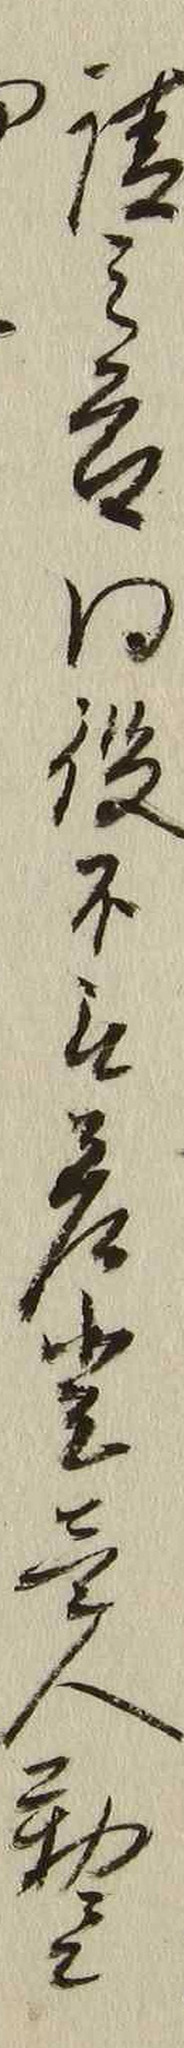請之節同役等被差登壱人勤ニて
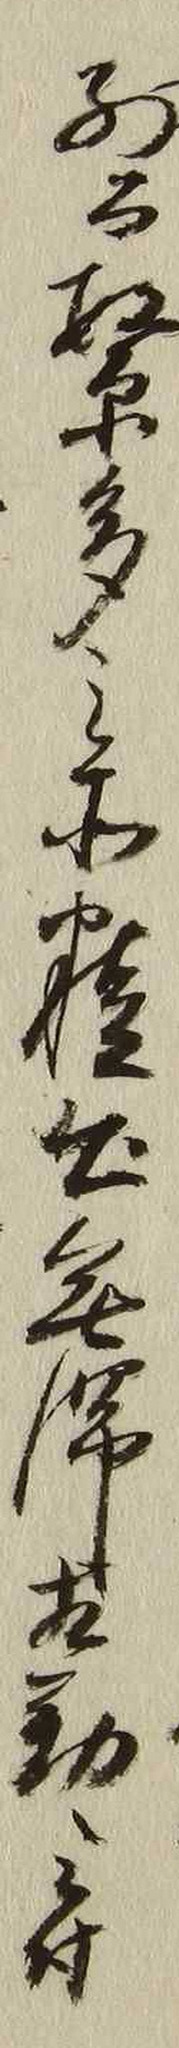別而繁多之所精出無滞相勤候ニ付
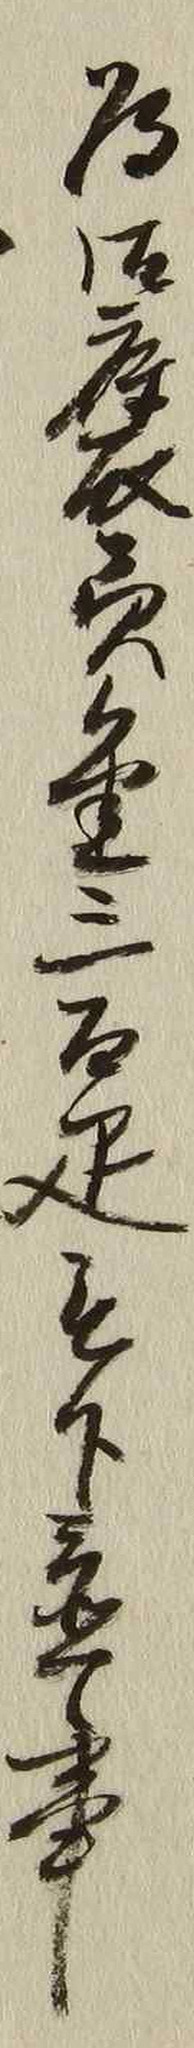為御褒美金三百疋被下置候事
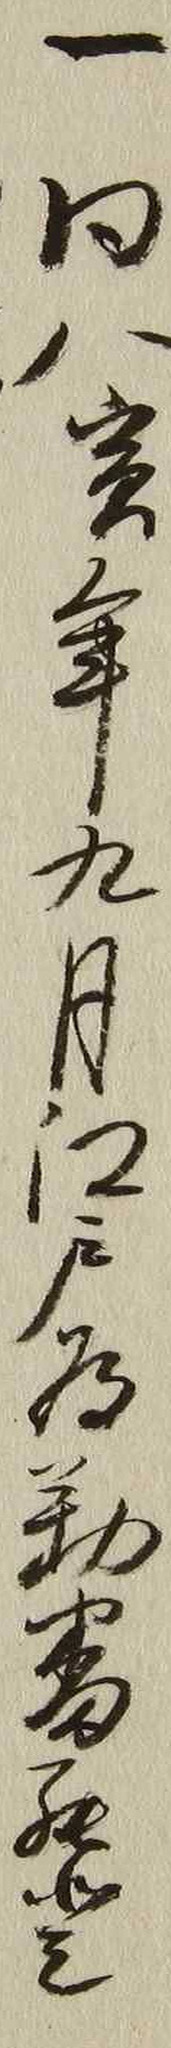一同八寅年九月江戸為勤番罷登
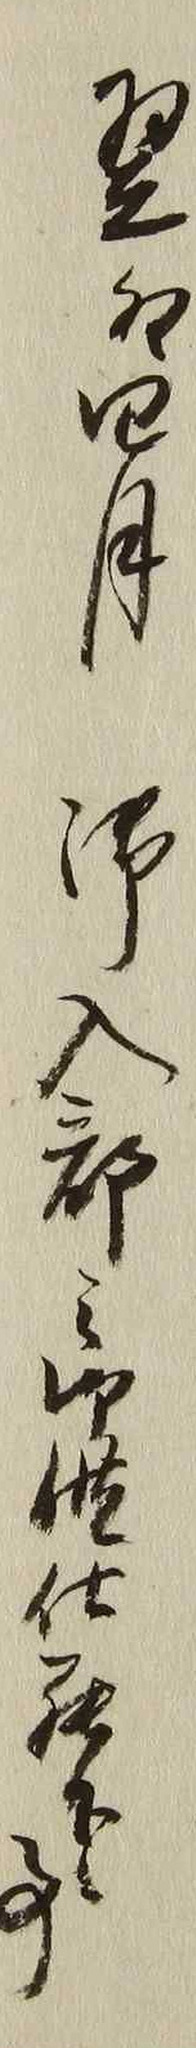翌卯四月御入部之御供仕罷下候事
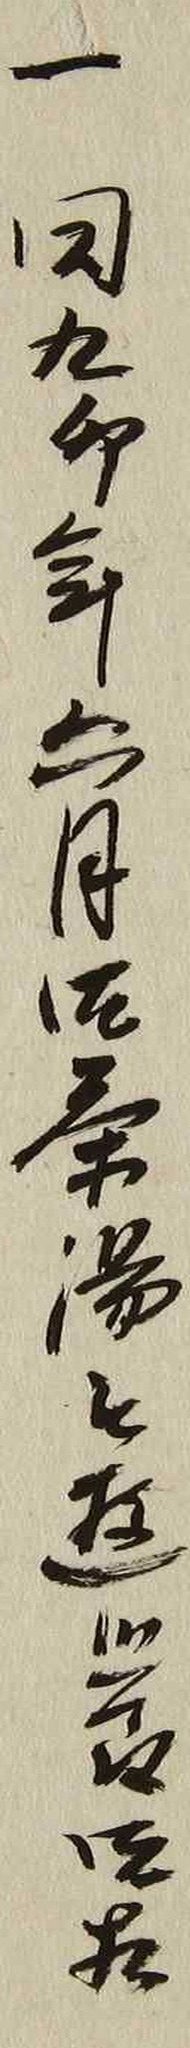一同九卯年六月御茶湯被遊候節御相
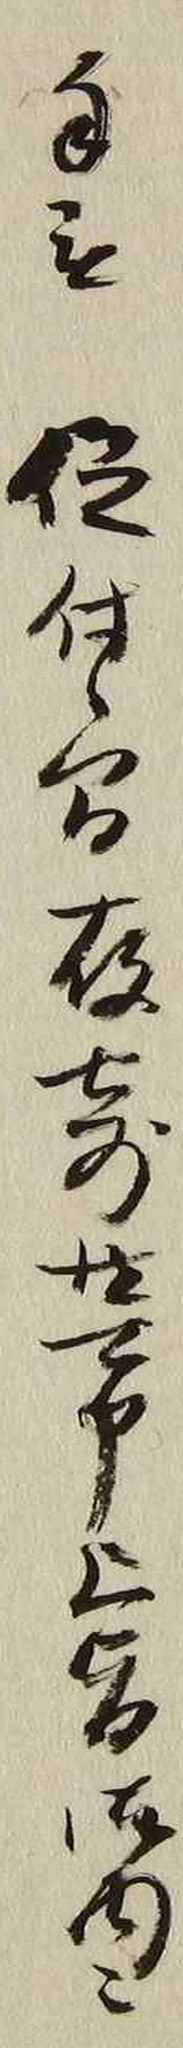手被仰付候間存寄共可申上旨御内々
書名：諸士系譜　巻之349　も之部5
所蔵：会津若松市立会津図書館
